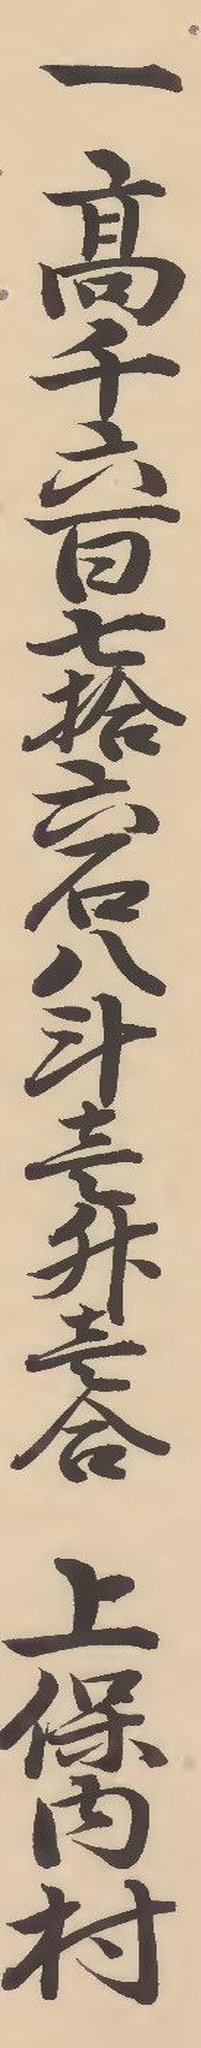一高千六百七拾六石八斗壱升壱合上保内村
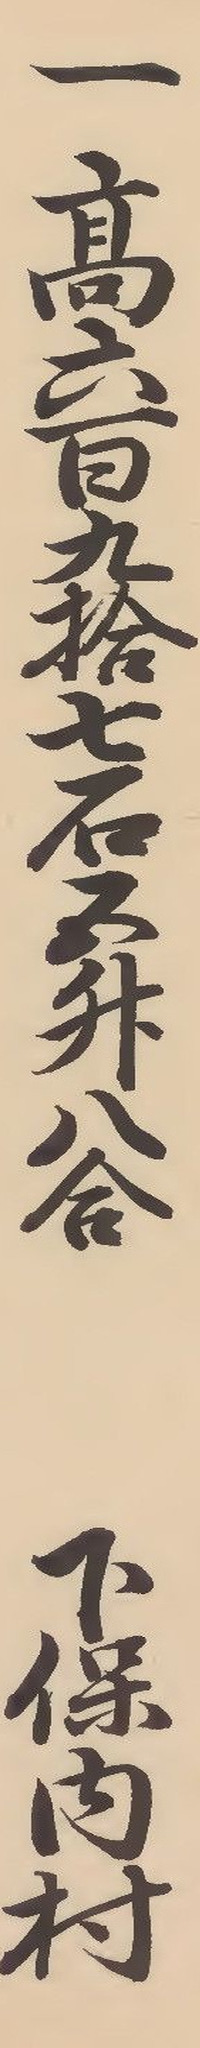一高六百九拾七石五升八合下保内村
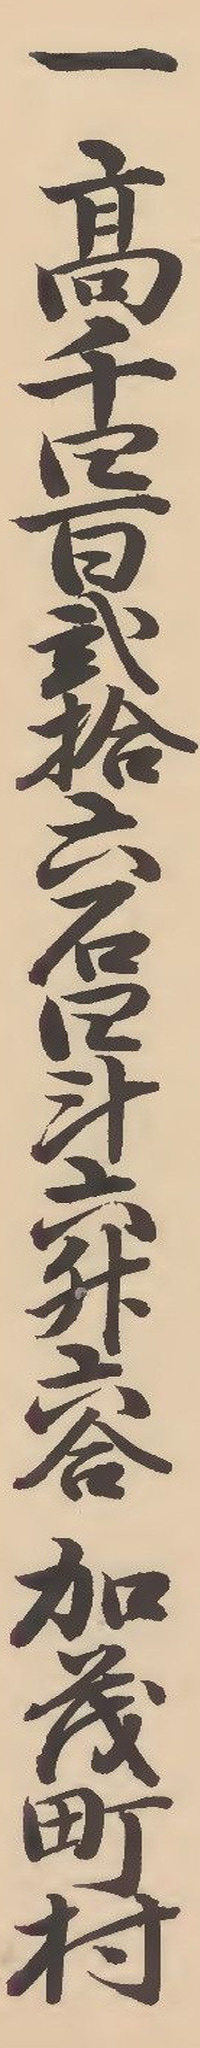一高千四百弐拾六石四斗六升六合加茂町村

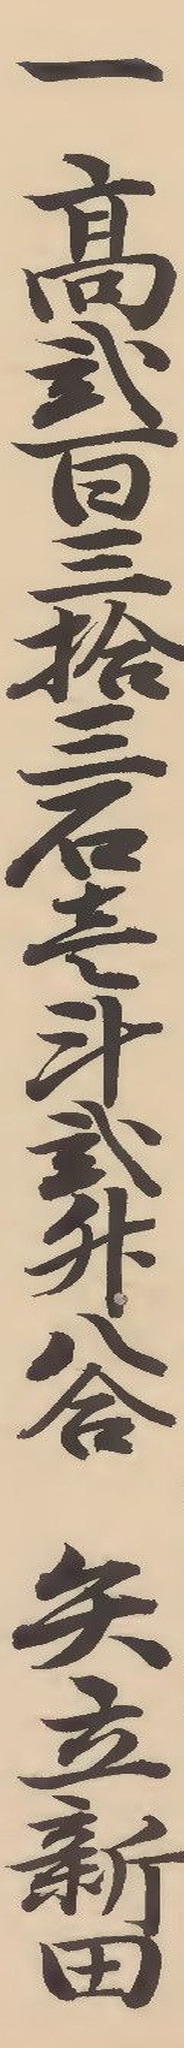一高弐百三拾三石壱斗弐升八合矢立新田
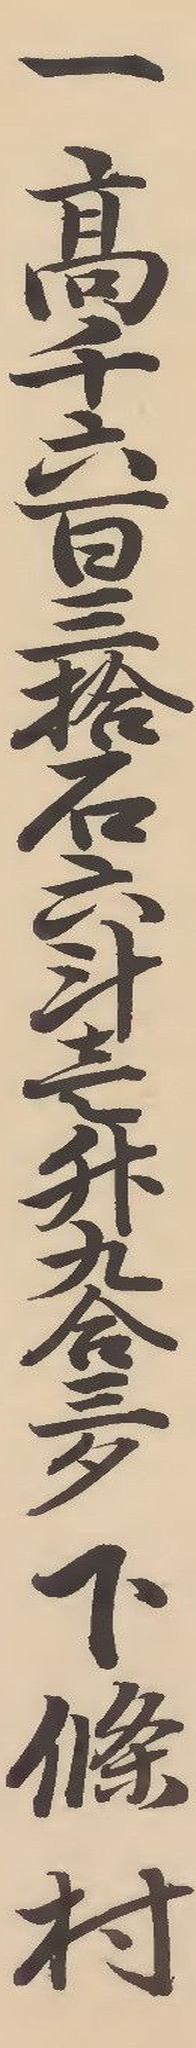一高千六百三拾石六斗壱升九合三勺下条村
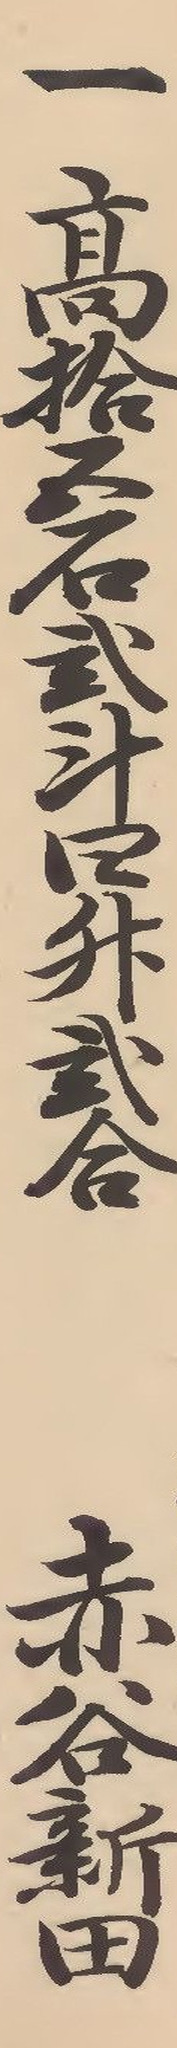一高拾五石弐斗四升弐合赤谷新田
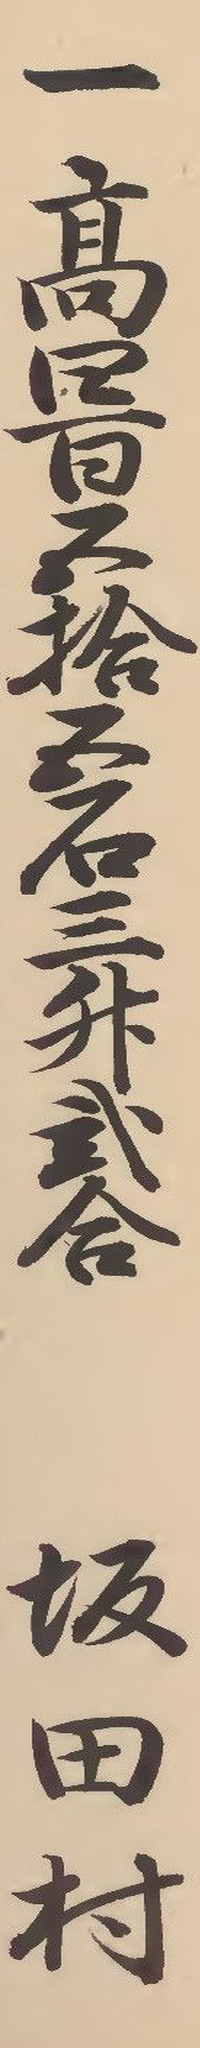一高四百五拾五石三升弐合坂田村
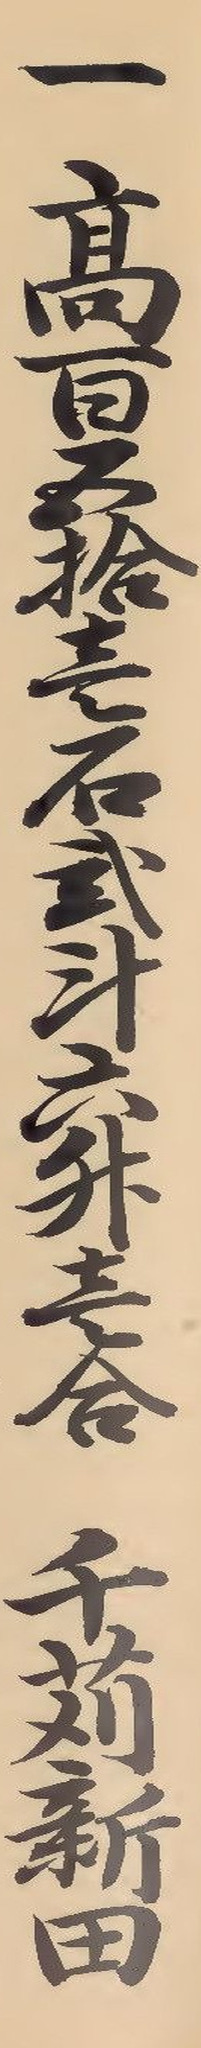一高百五拾壱石弐斗六升壱合千苅新田
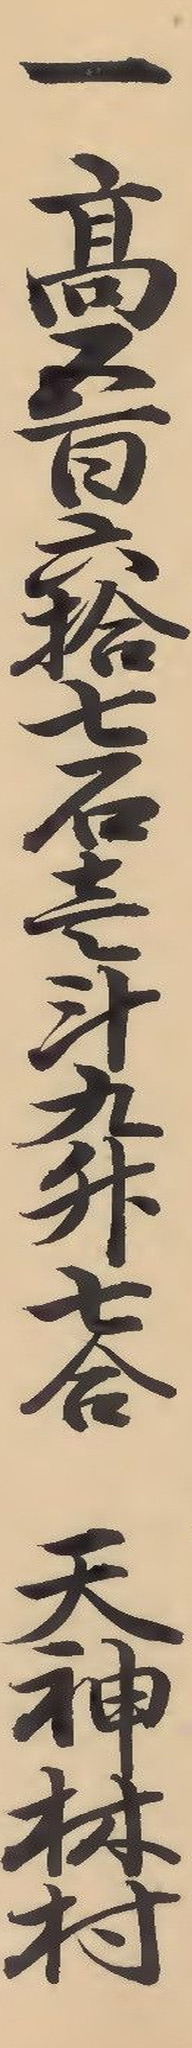一高五百六拾七石壱斗九升七合天神林村
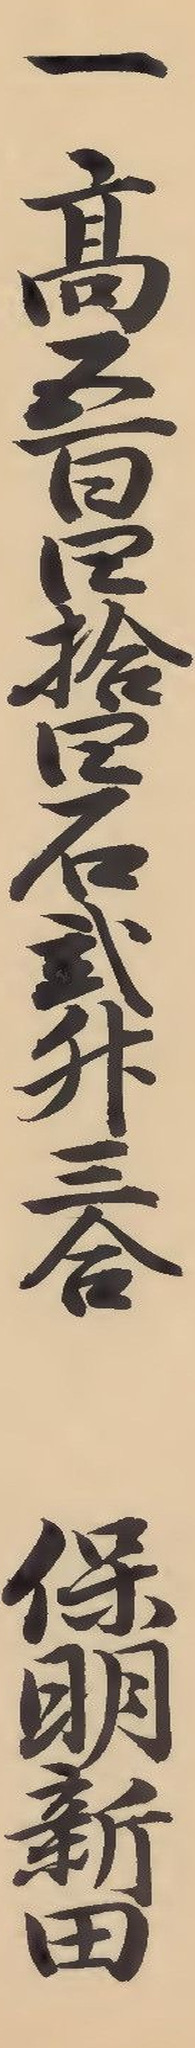一高五百四拾四石弐升三合保明新田
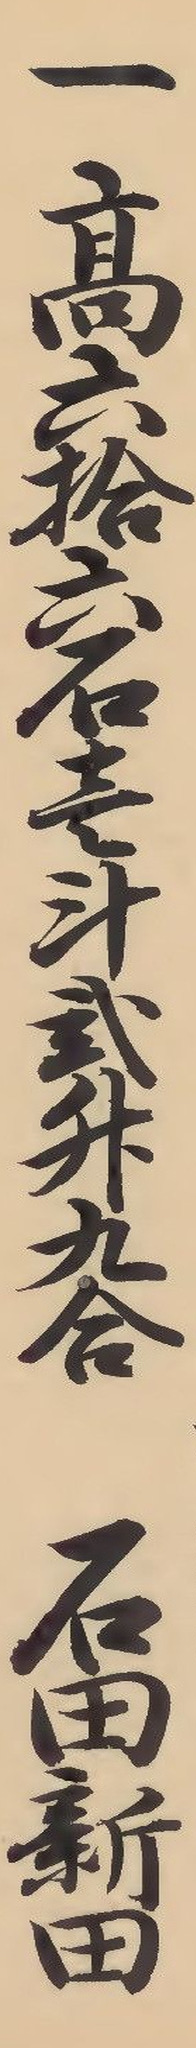一高六拾六石壱斗弐升九合石田新田

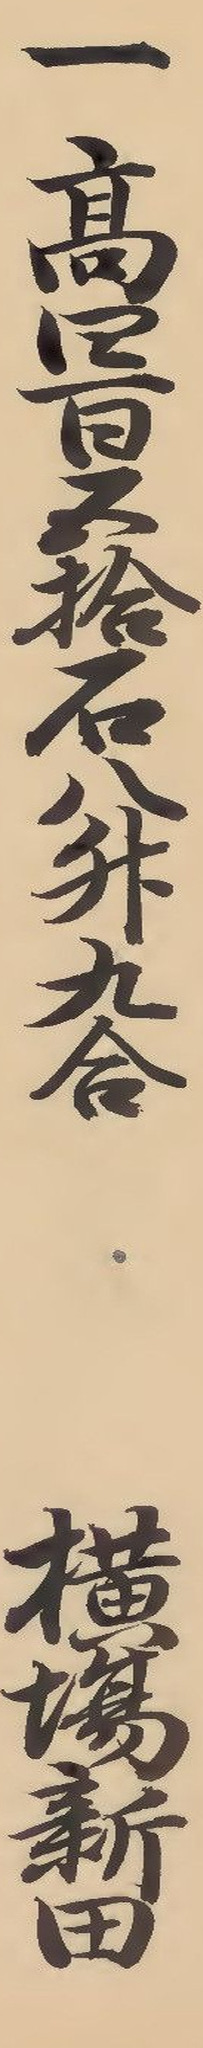一高四百五拾石八升九合横場新田
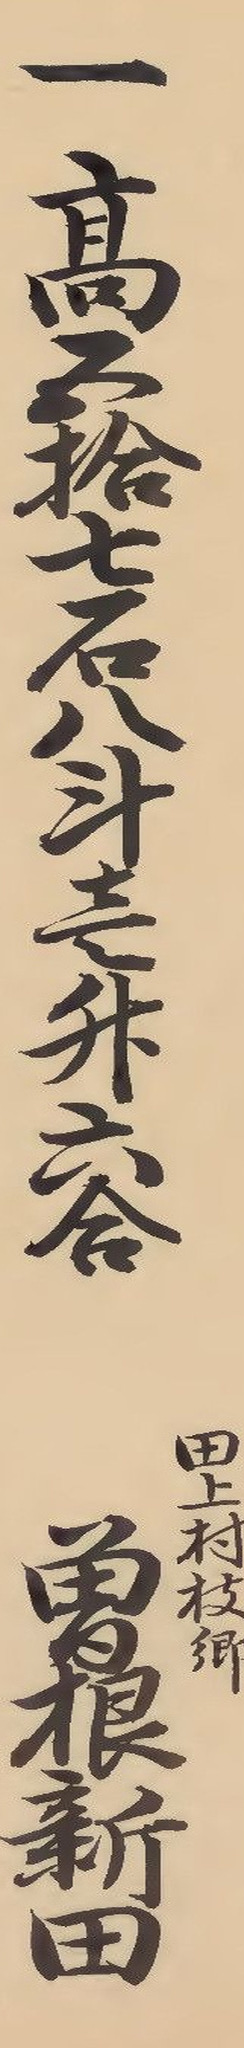一高五拾七石八斗壱升六合曽根新田
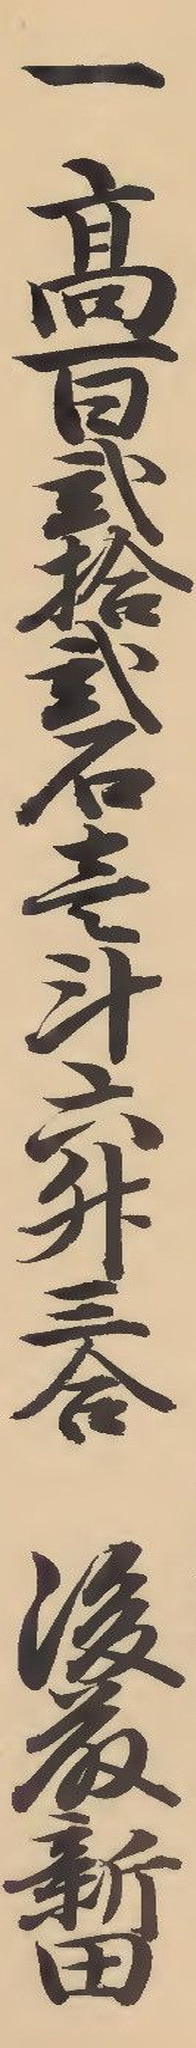一高百弐拾弐石壱斗六升三合後藤新田
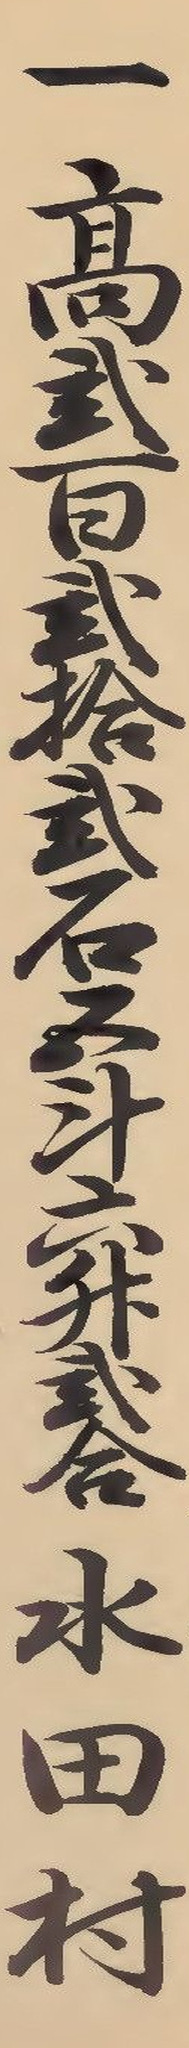一高弐百弐拾弐石五斗六升弐合水田村
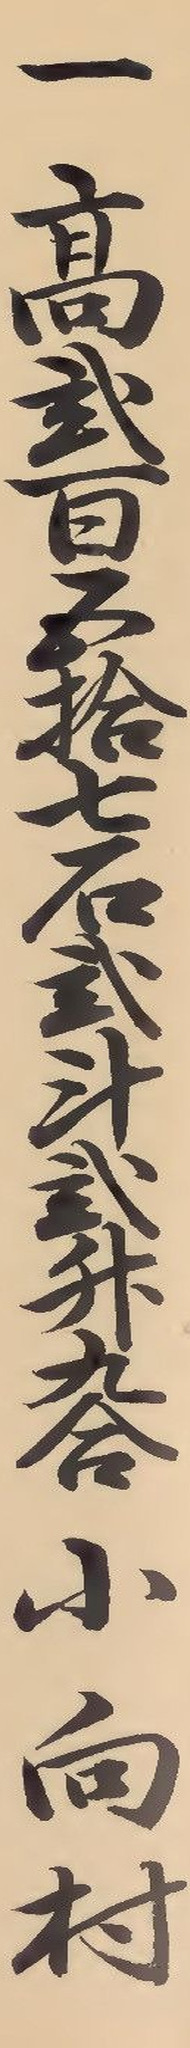一高弐百五拾七石弐斗弐升九合小向村
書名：越後国郷帳　下
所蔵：国立公文書館 National Archives of Japan
